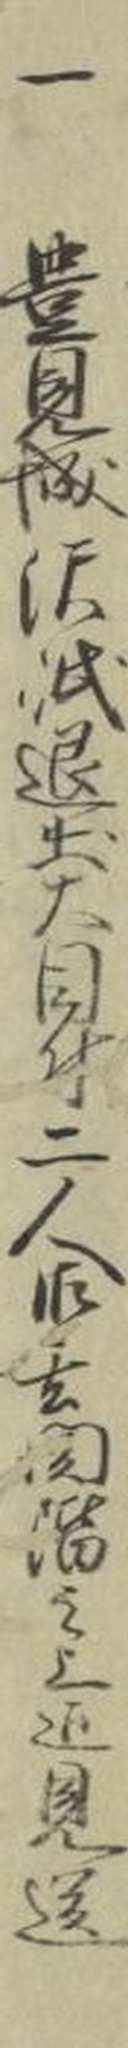一豊見城沢岻退出大目付二人御玄関階之上迄見送
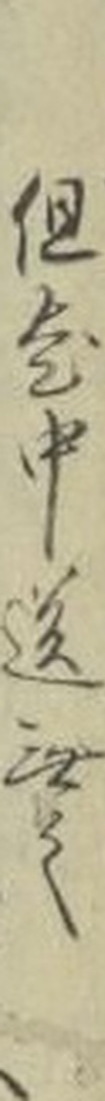但老中送無之
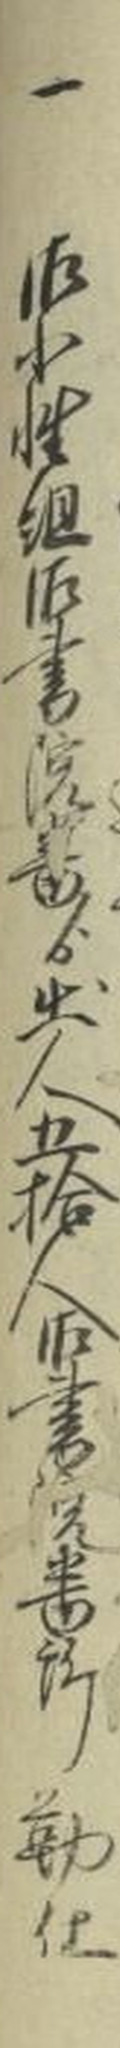一御小性組御書院番ゟ出人五拾人御書院番所勤仕
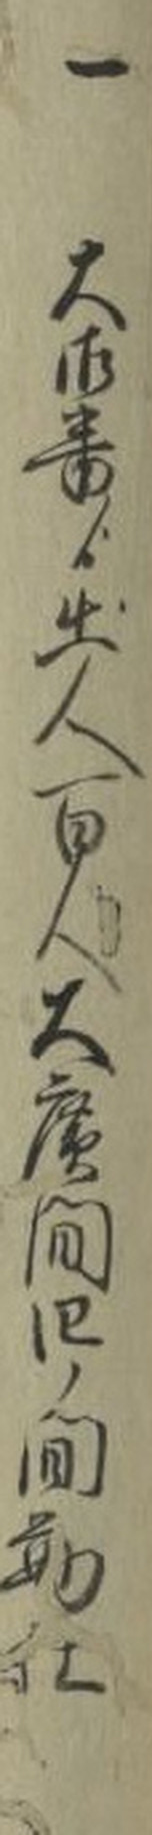一大御番ゟ出人百人大広間四之間勤仕
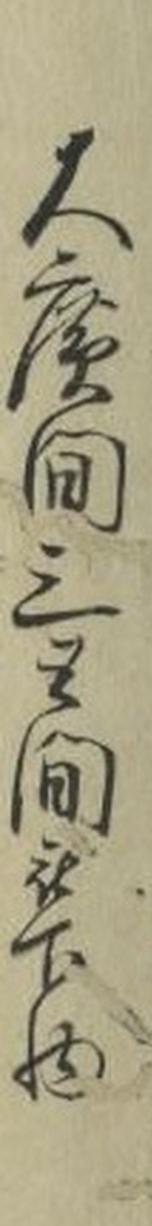大広間三之間被下物

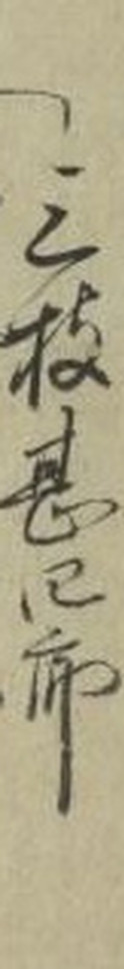三枝甚四郎
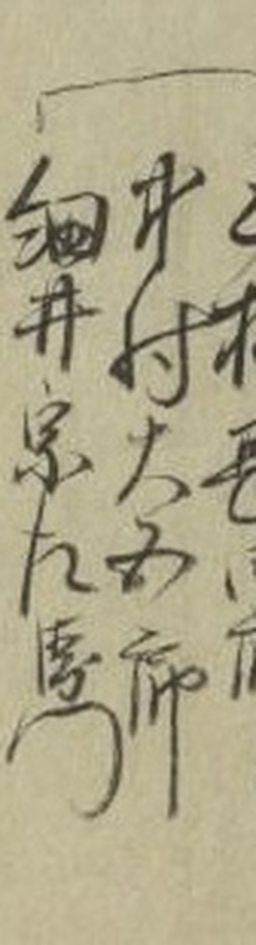細井宗左衛門
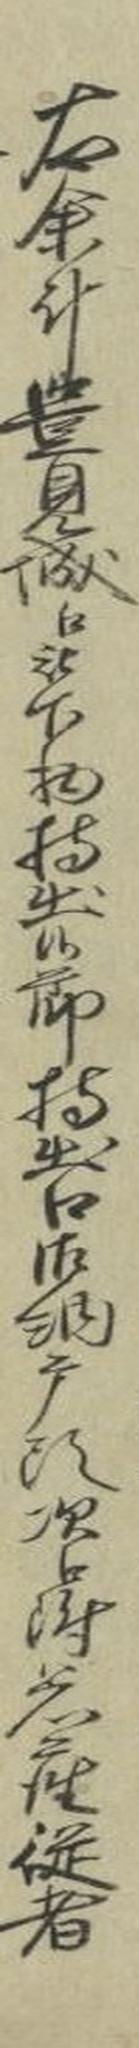右余計豊見城え被下物持出候節持出口御納戸頭次え附着座従者
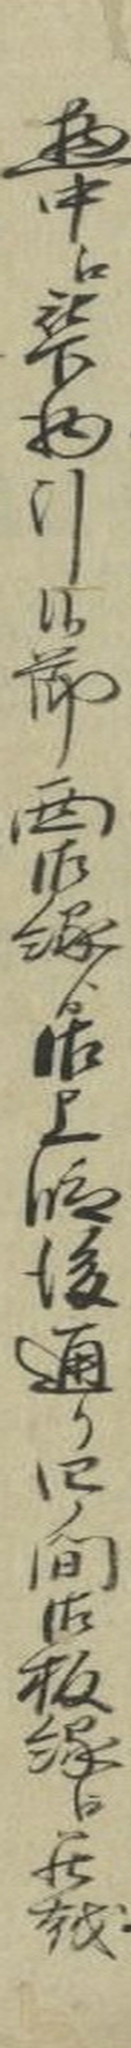惣中え被下物引候節西御縁ゟ御上段後通り四の間御板縁え罷越
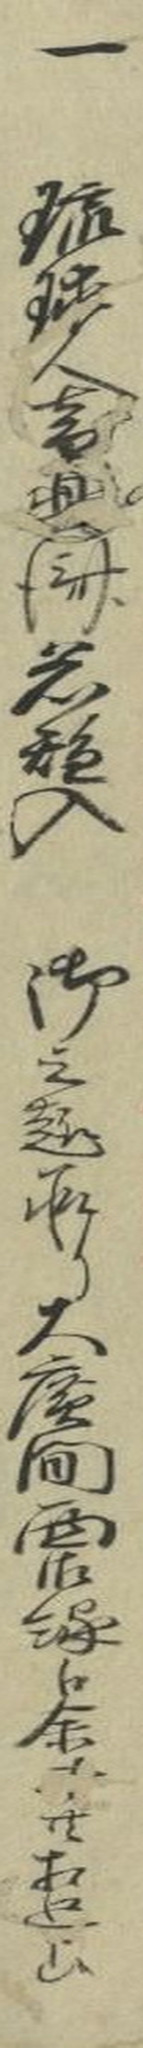一琉球人音楽済着替入御之趣承り大広間西御縁え余計共相廻申候
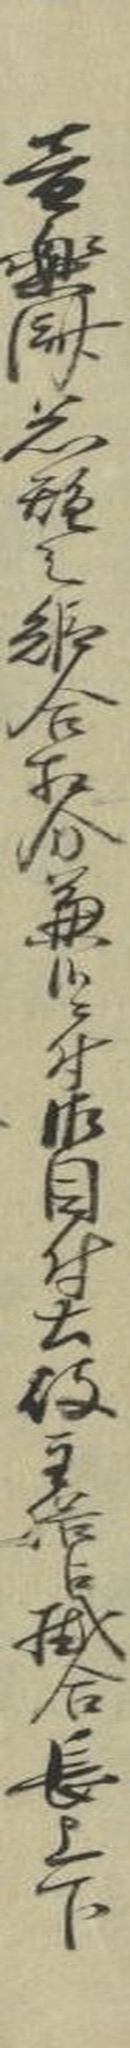一音楽済着替之緞合相分兼候に付御目付土岐主膳え掛合長上下
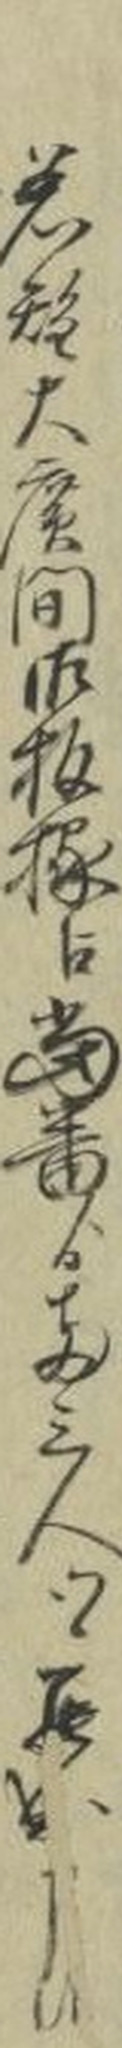着替大広間御板縁え当番ゟ両三人つゝ罷出申候
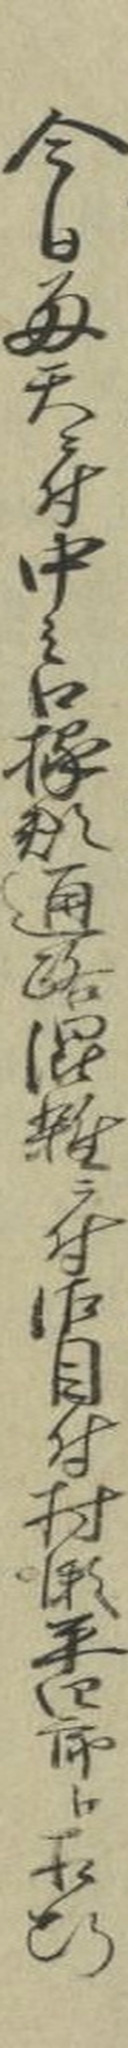一今日雨天に付中之口縁頬通路混雑に付御目付村瀬平四郎え相断
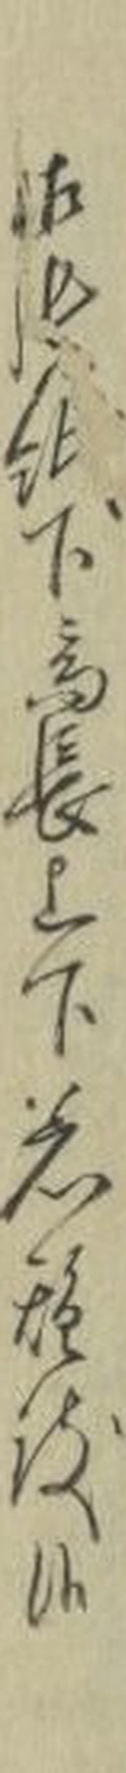御張紙下にて長上下着替致候
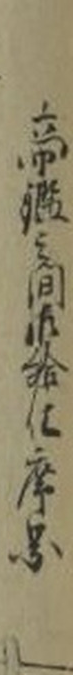帝鑑之間御給仕席図
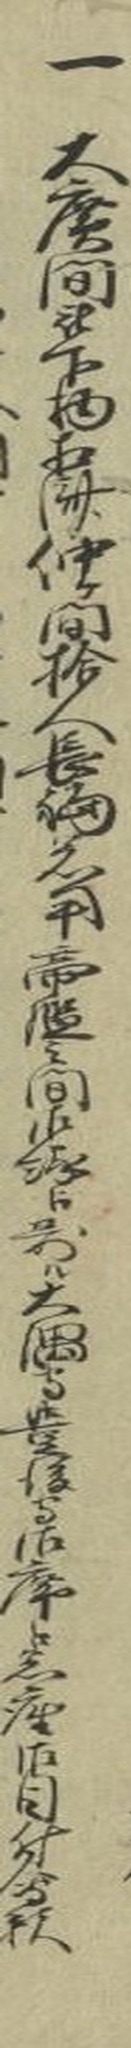一大広間被下物相済仲か間拾人長襠着用帝鑑之間御縁え寄る大隅守豊後守御席え着座御目付会釈
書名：天保三壬辰年琉球人参府之節勤方書留
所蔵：University of the Ryukyus Library
